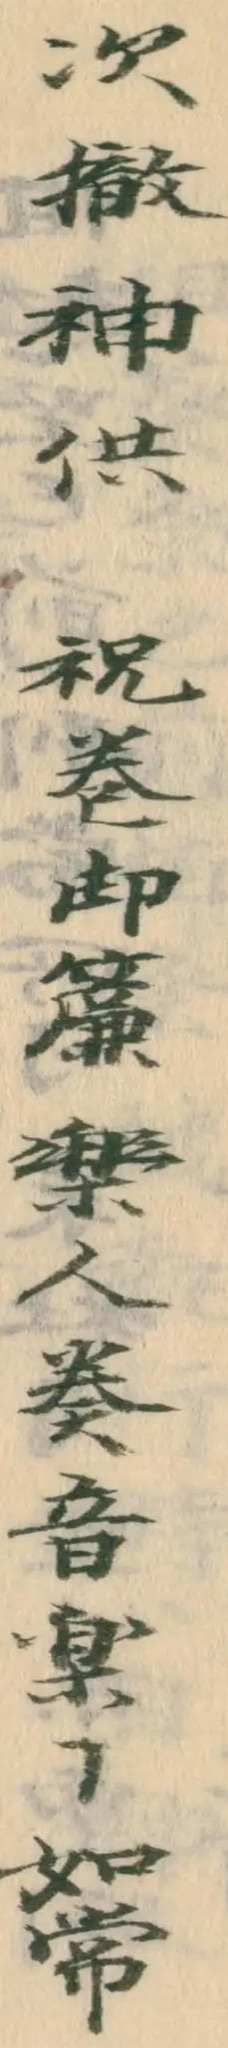次撤神供祝巻御簾楽人奏音楽コト如常
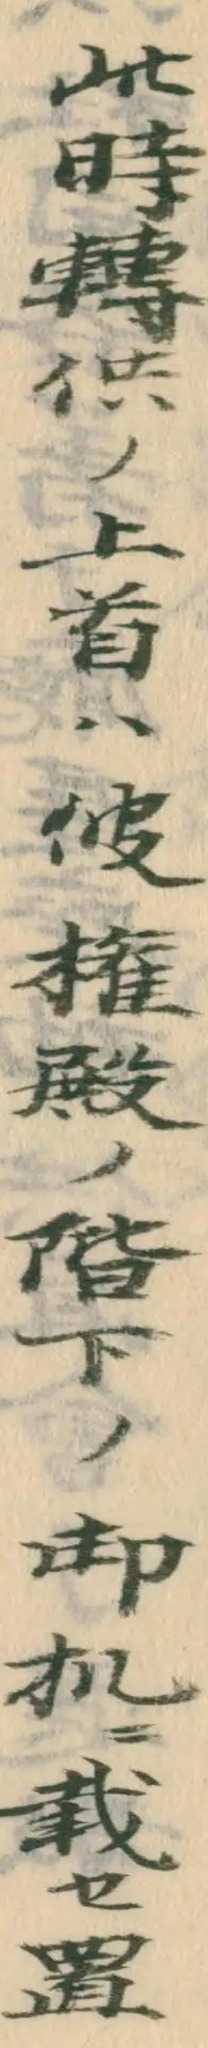此時転供ノ上首ハ彼権殿ノ階下ノ御机ニ載セ置
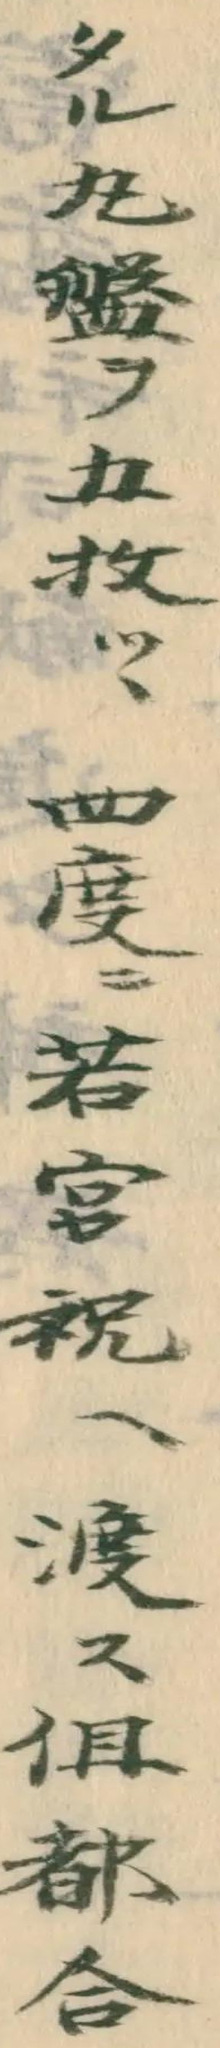タル丸盤ヲ五枚ツヽ四度ニ若宮祝ヘ渡ス但都合
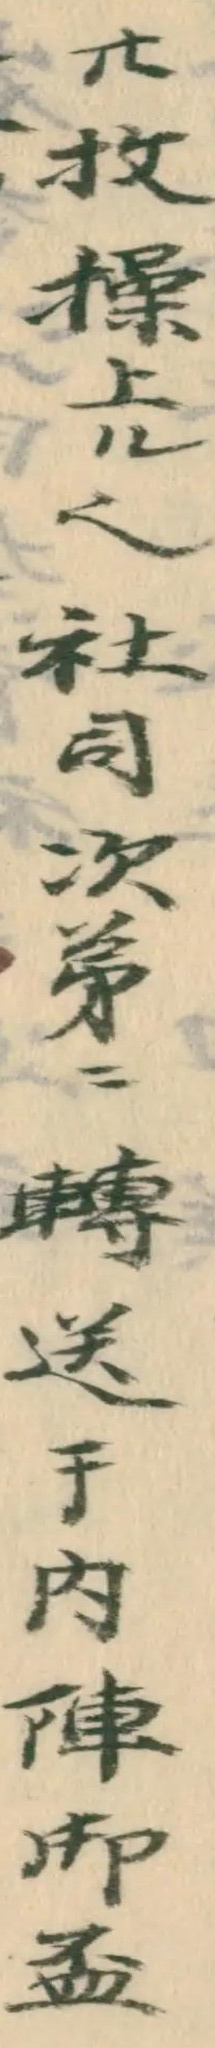廿枚操上ル也社司次第二転送于内陣御盃
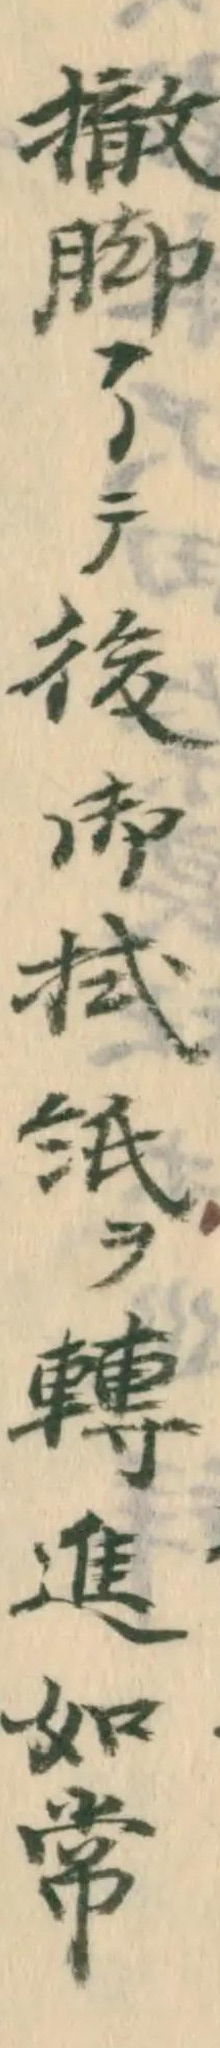撤脚了テ後御拭紙ヲ転進如常
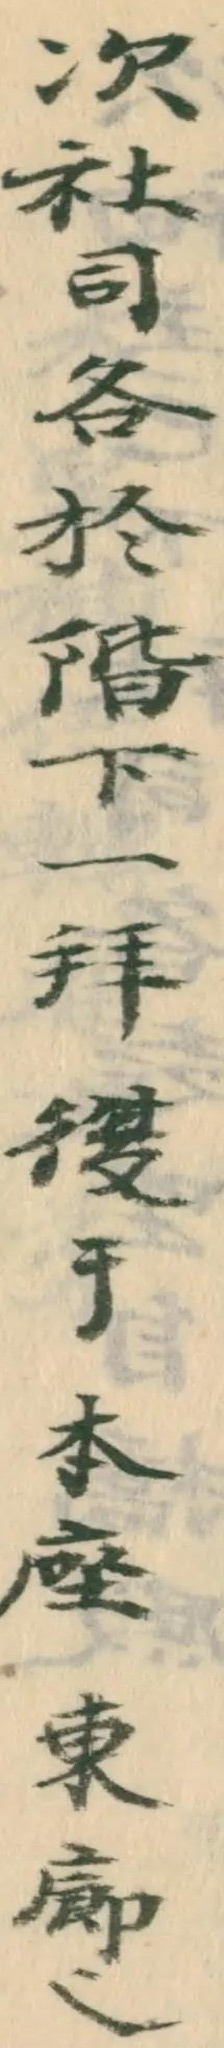次社司各於階下一拝復于本座東廊也
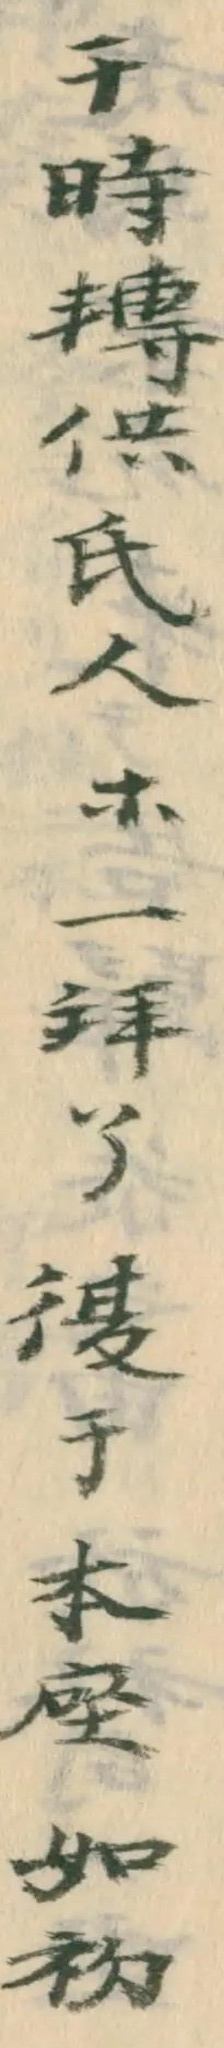于時転供氏人等一拝了復于本座如初
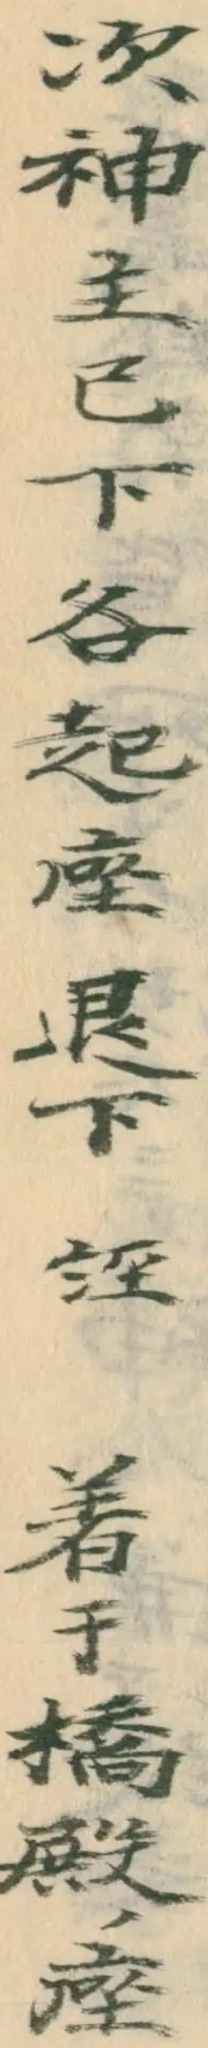次神主已下各起座退下経着于橋殿ノ座

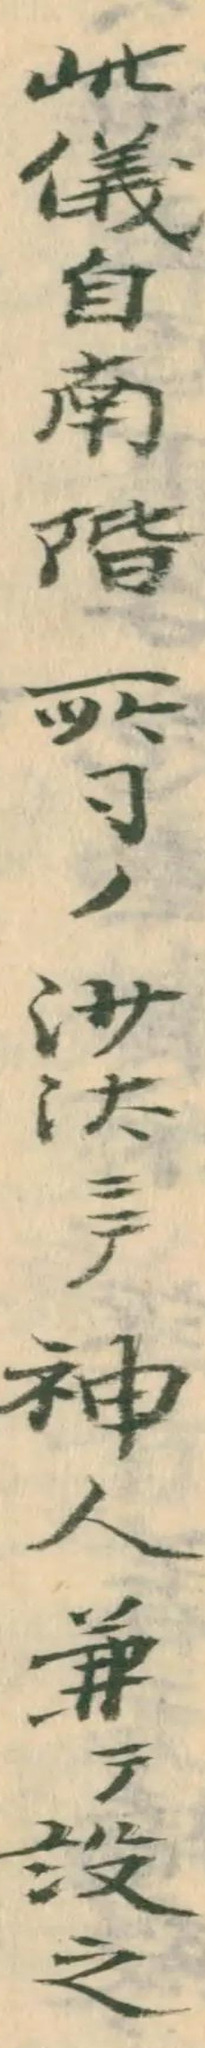此儀自南階所司ノ沙汰ニテ神人兼テ設之
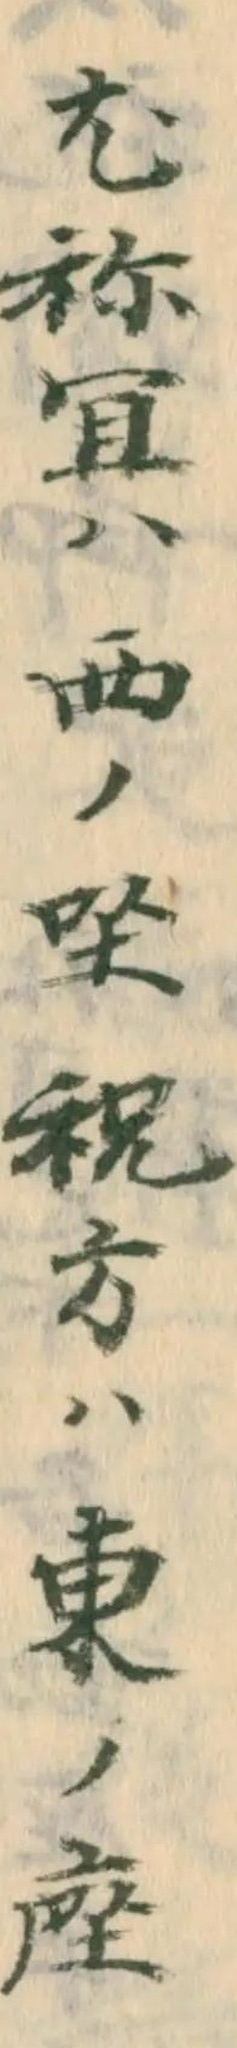尤禰宜ハ西ノ坐祝方ハ東ノ座
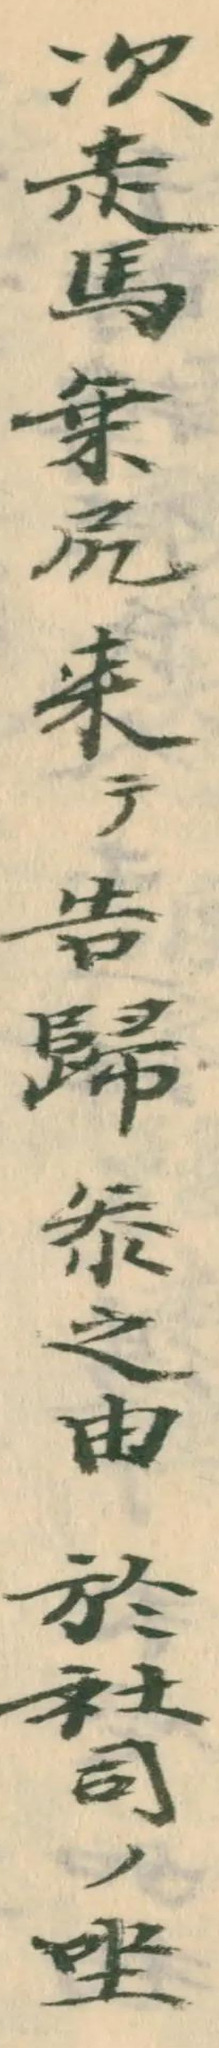次走馬乗尻来テ告帰参之由於社司ノ坐
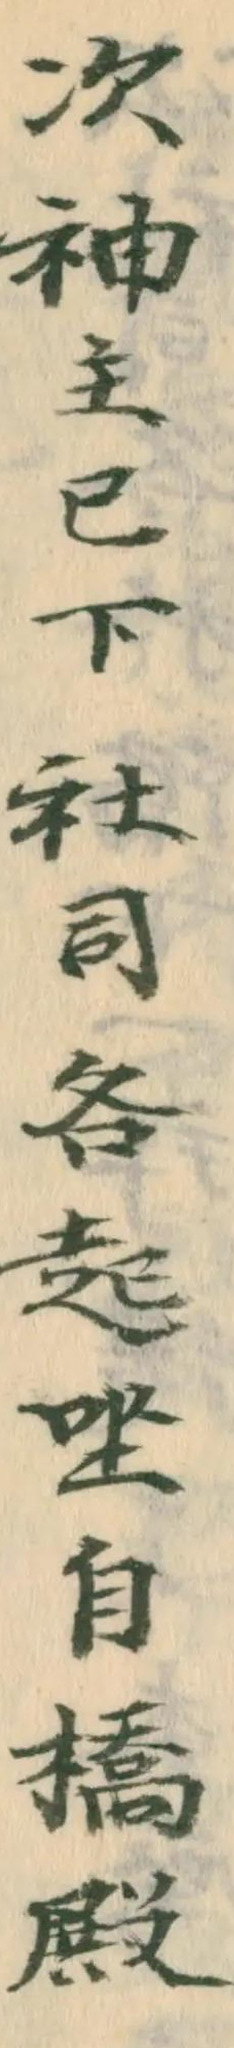次神主已下社司各起坐自橋殿
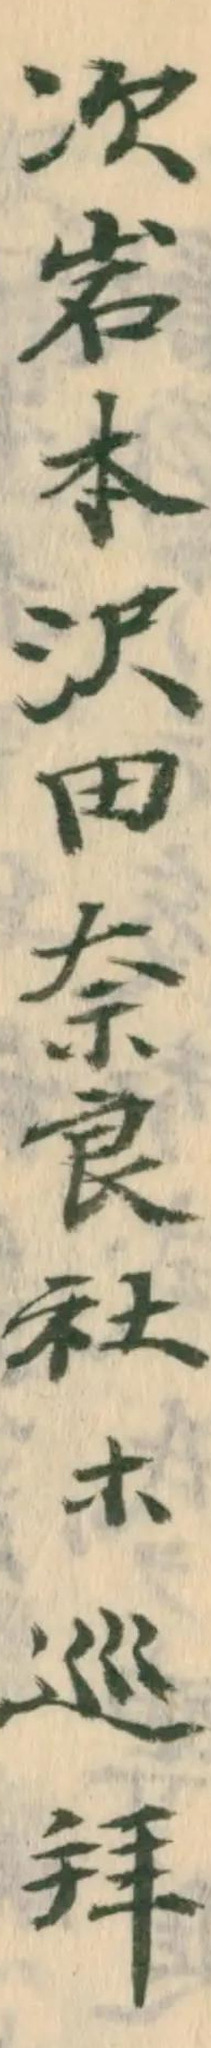次岩本沢田奈良社等巡拝
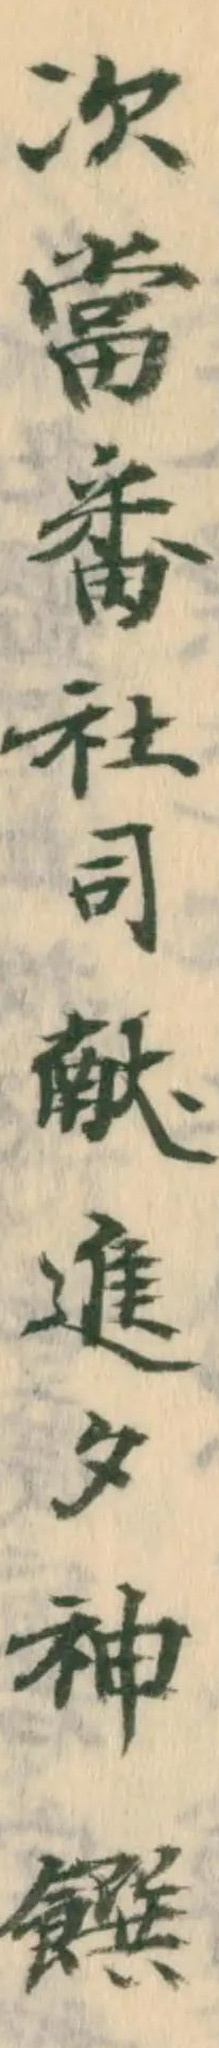次当番社司献進夕神饌
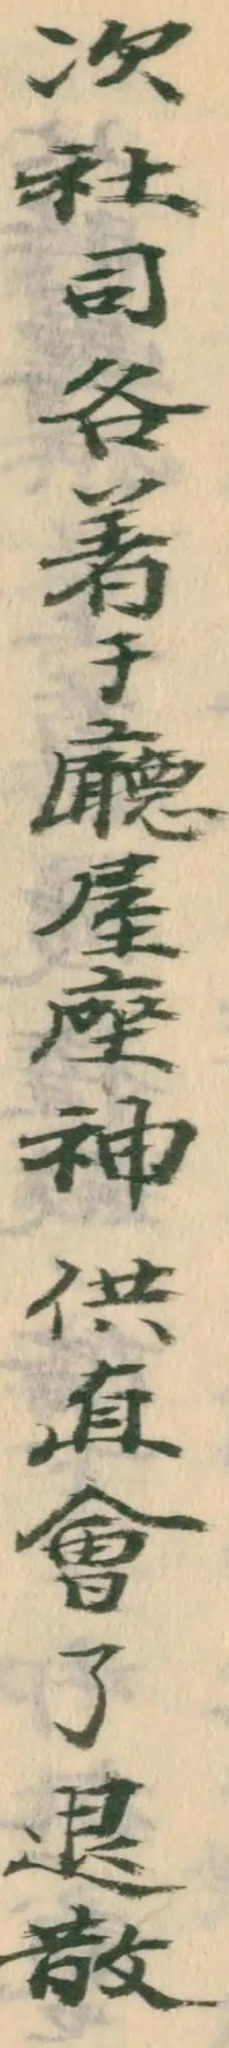次社司各着于庁屋座神供直会了退散
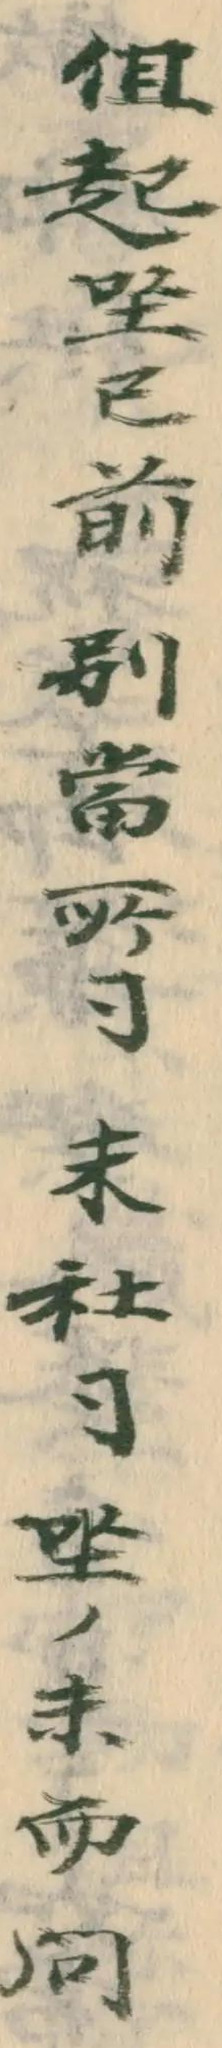但起坐已前別当所司末社司坐ノ末而問
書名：賀茂社記録. 第5冊
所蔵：国立国会図書館 National Diet Library, JAPAN
